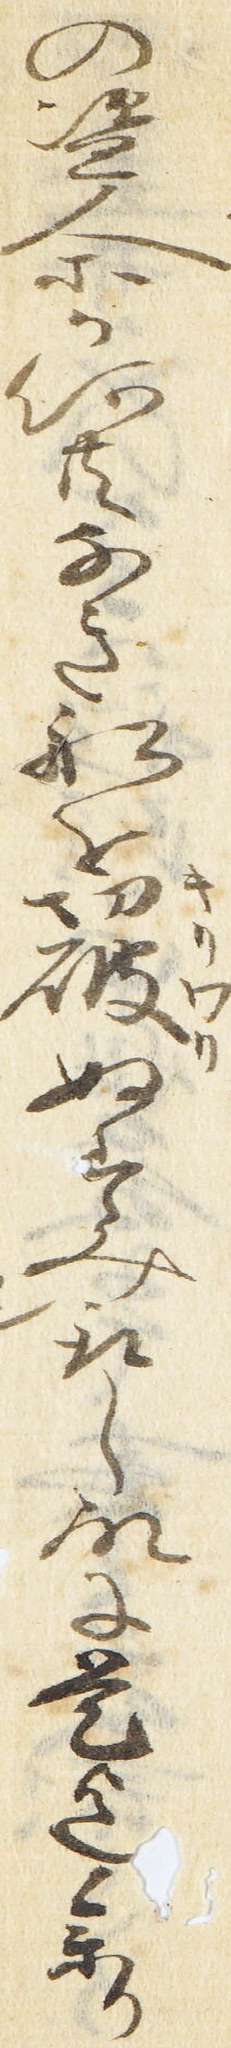の盗人等か何共なき船を切破ぬすみ取し故に是迄参り
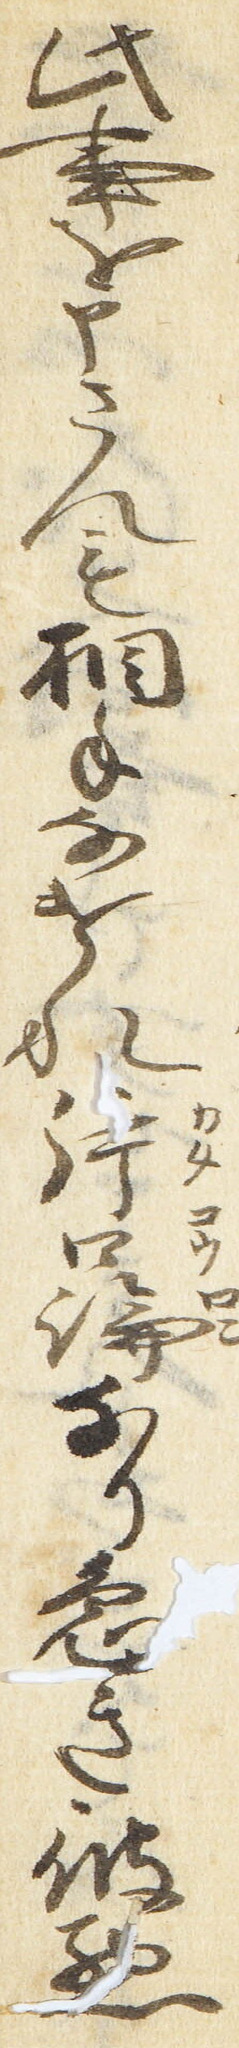此事を申さんも相手なけれは片口論なり急き彼悪

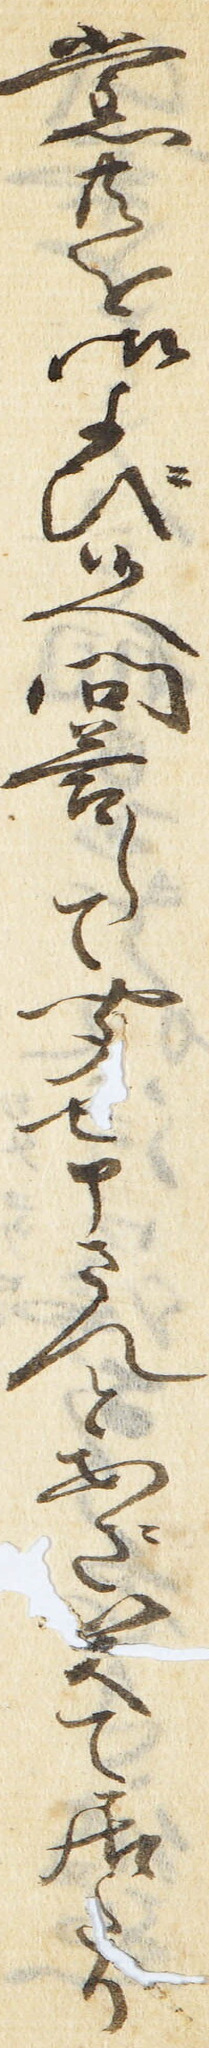党共を御よび候へ問答して聞せ申さんとあざ笑て居たり
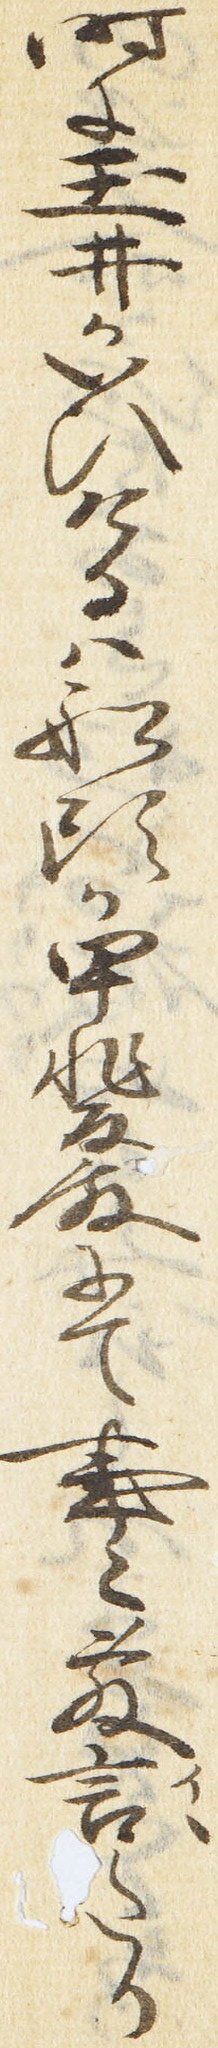時に玉井かいひけるは船頭か甲斐殿にて事々敷言たり
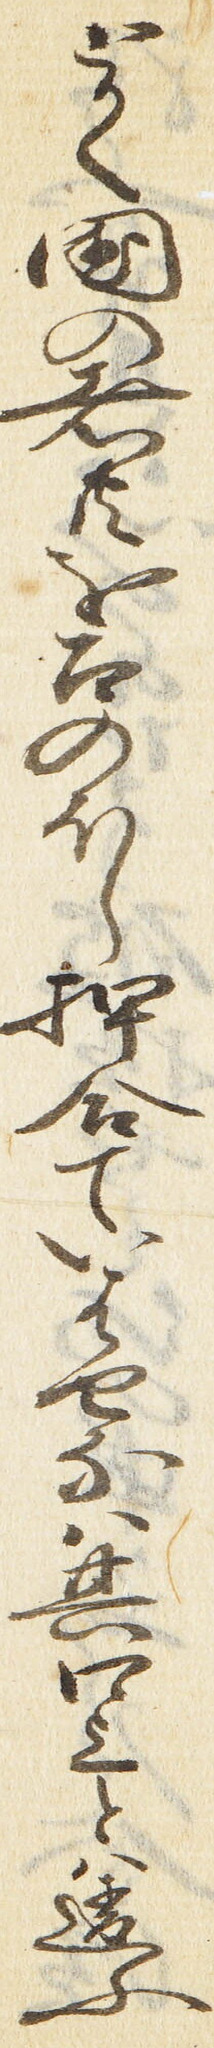とかく国の者共を召のほし押合ていはせなは其口上とは違ふ
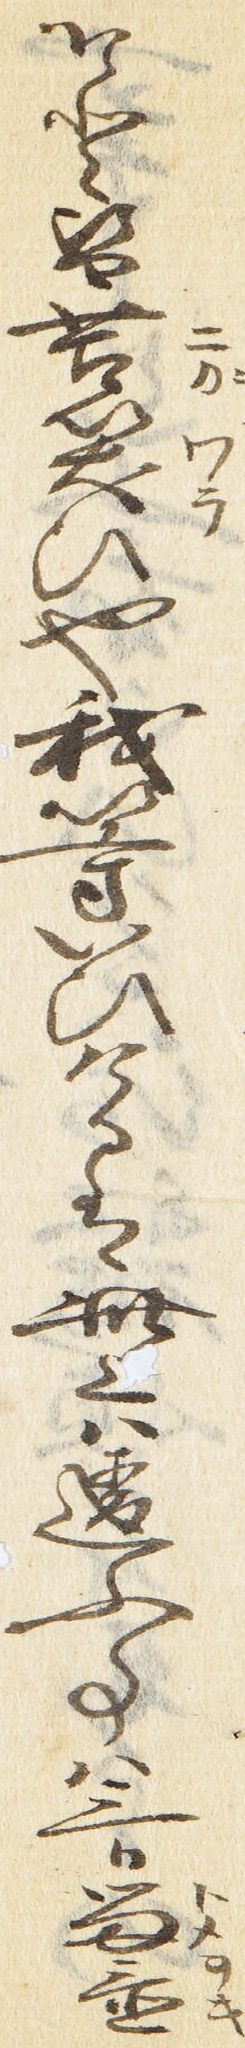そと皆苦笑ひ也我等いひけるは此上は違ふ事は三日留置
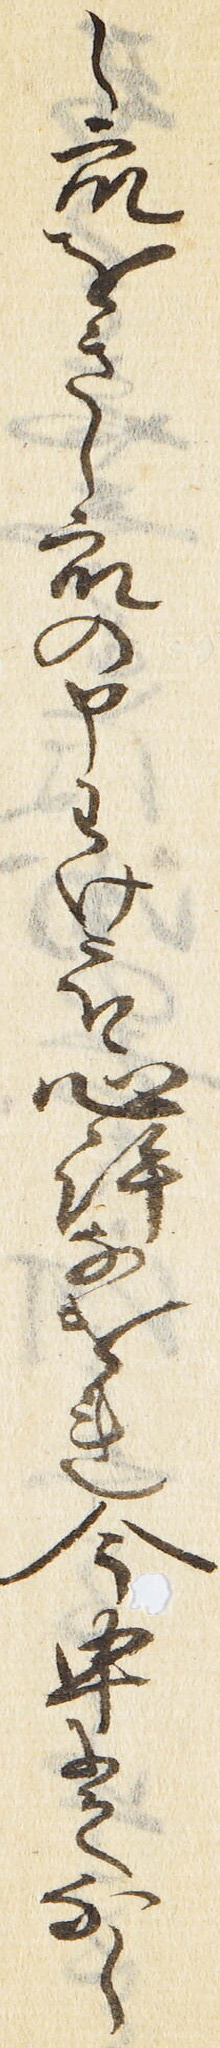し衆をきし衆の申わけこそ心許なけれ今申にてなし
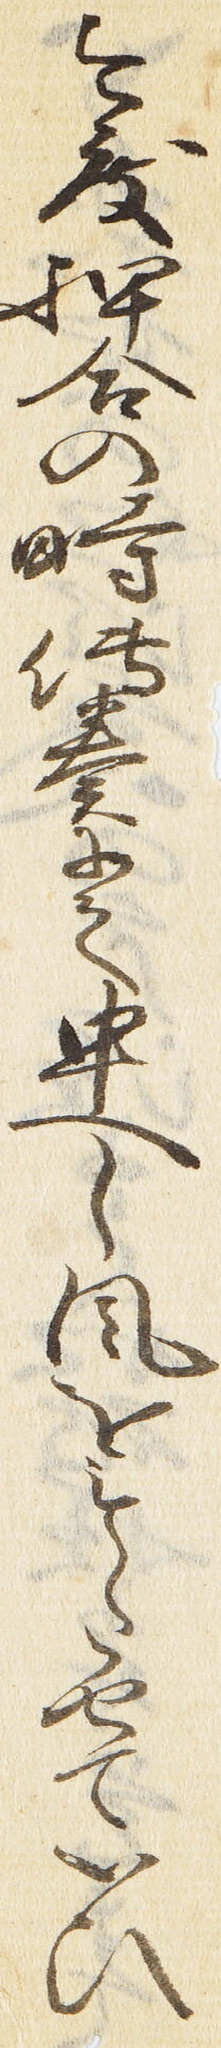今度押合の時伝奏にて申へし風をもたせていひ
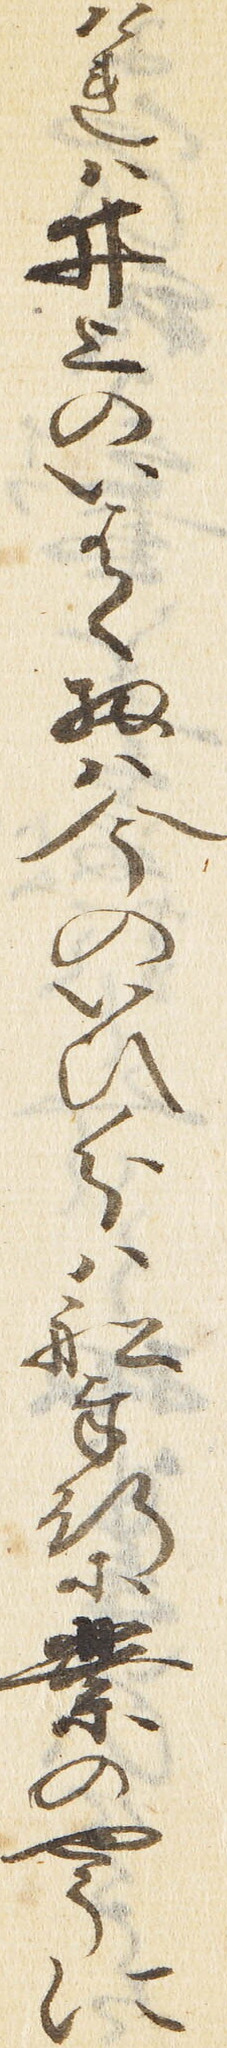けれは井上のいはく扨は今のいひ分は船奉行等業のやうに
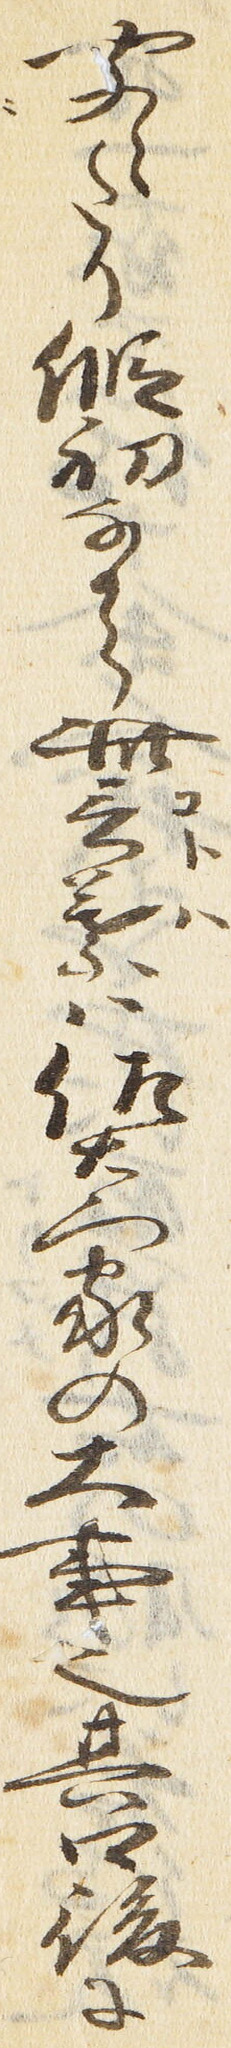聞えたり假初なから此言葉は佐右衛門家の大事也其口後に
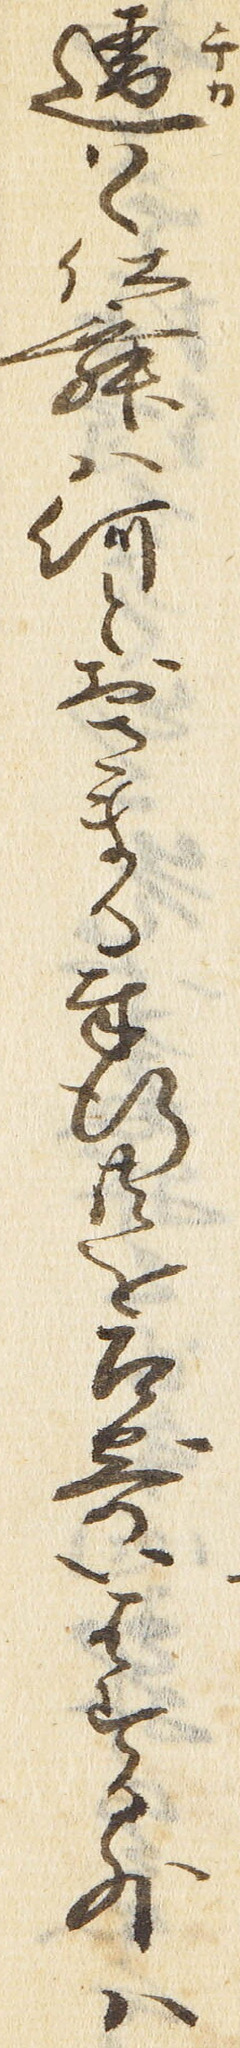違はゝ仕舞は何とおさまる奉行共を召寄いはする外は
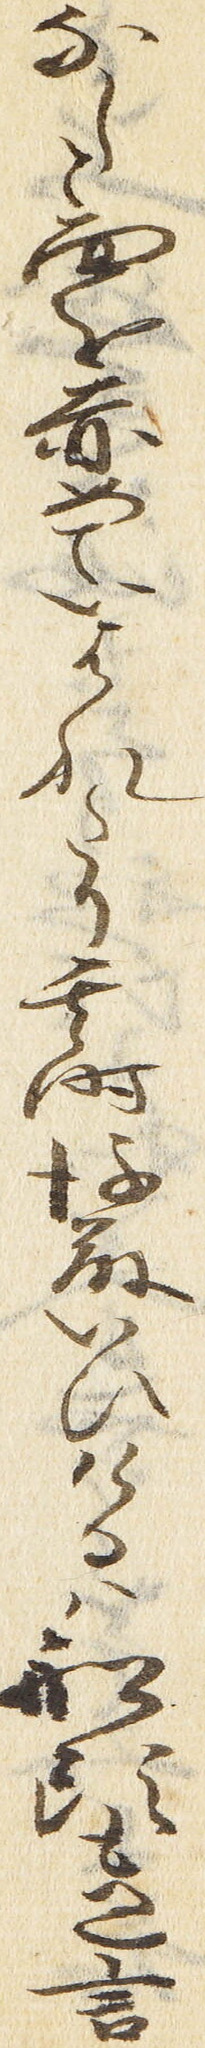なしと面を赤めていはれたり其時後藤いひけるは船頭も過言
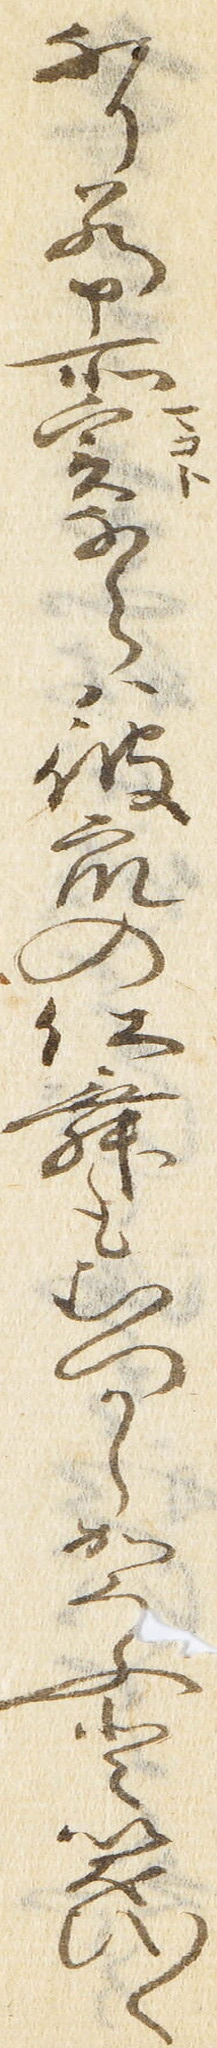なり若申所実ならは彼衆の仕舞もむつかしかろふと笑ひ〳〵
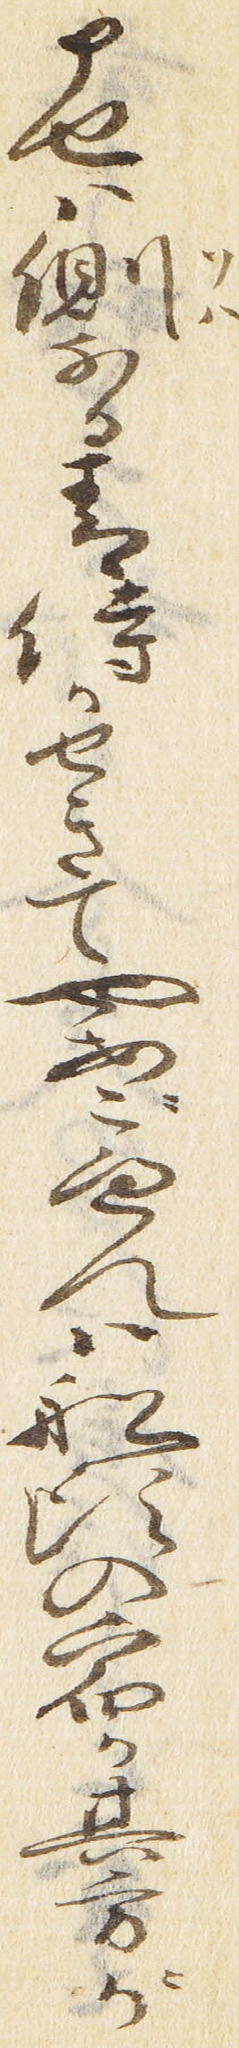申せは側なる青侍かせきてやあごへんは船頭の宿か其方が
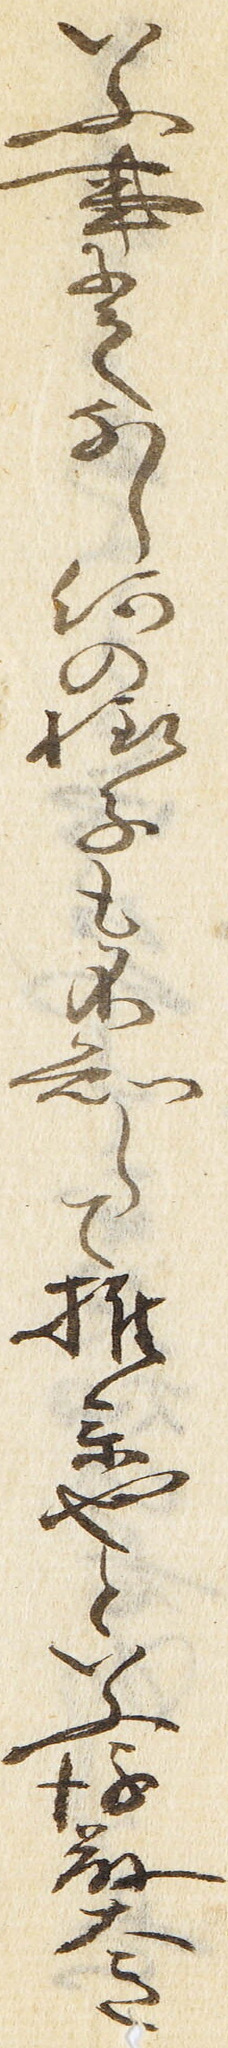いふ事にてなし何の様子も不知して推参やといふ後藤大き
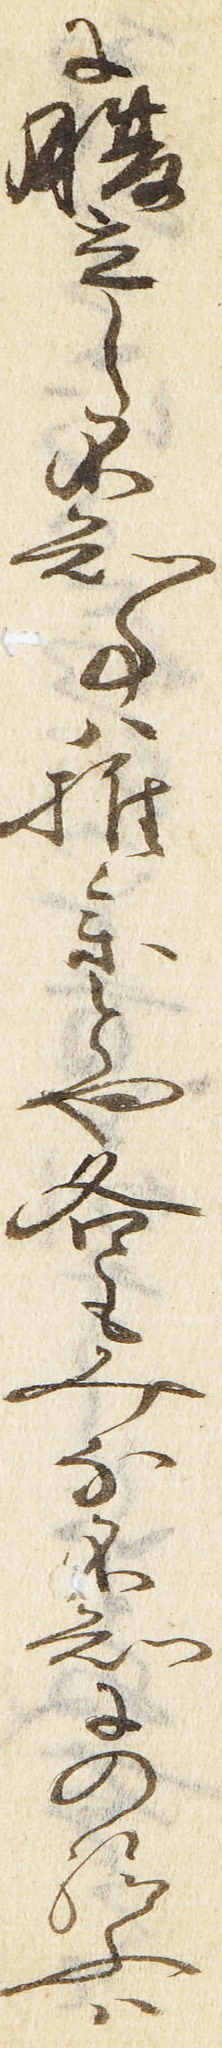に腹立し不知事は推参とや各もみな不知にの給ふは
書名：海陸世話日記
